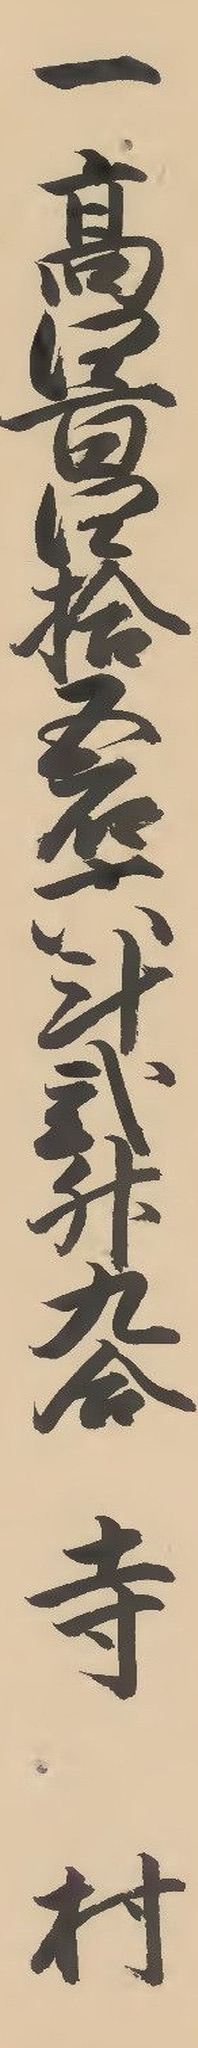一髙四百四拾五石六斗弐升九合寺村
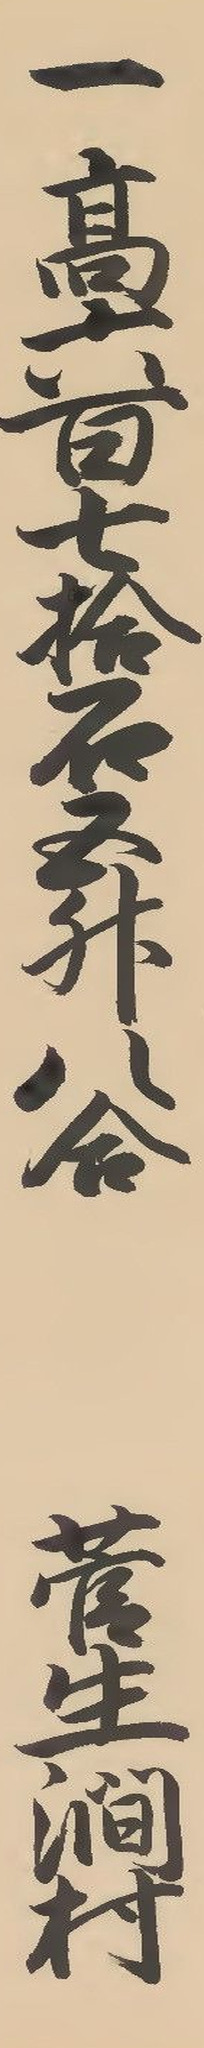一髙六百七拾石五升八合菅生澗村
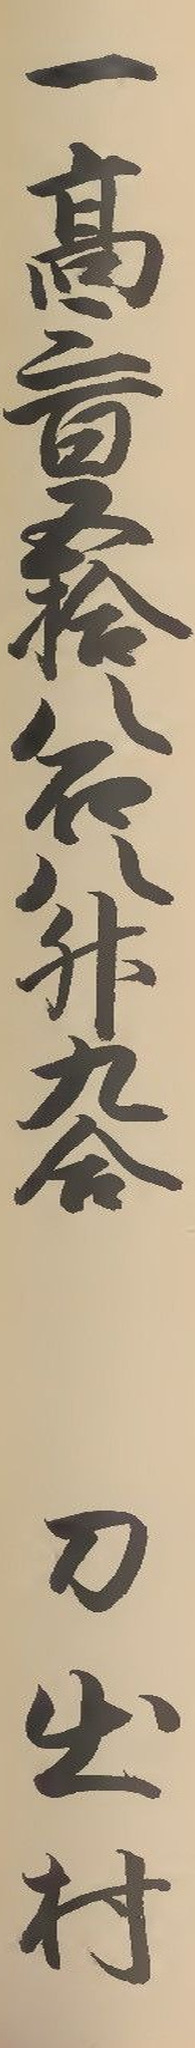一髙三百五拾八石八升九合刀出村
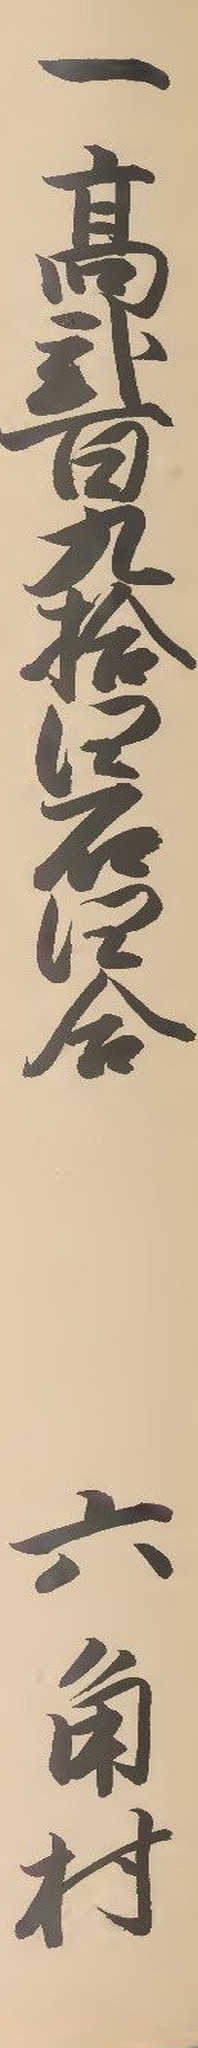一髙弐百九拾四石四合六角村
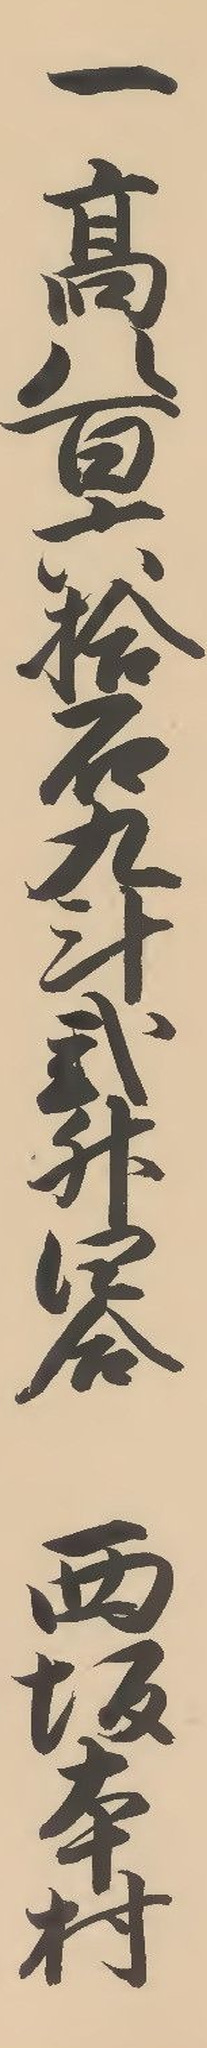一髙八百六拾石九斗弐升四合西坂本村
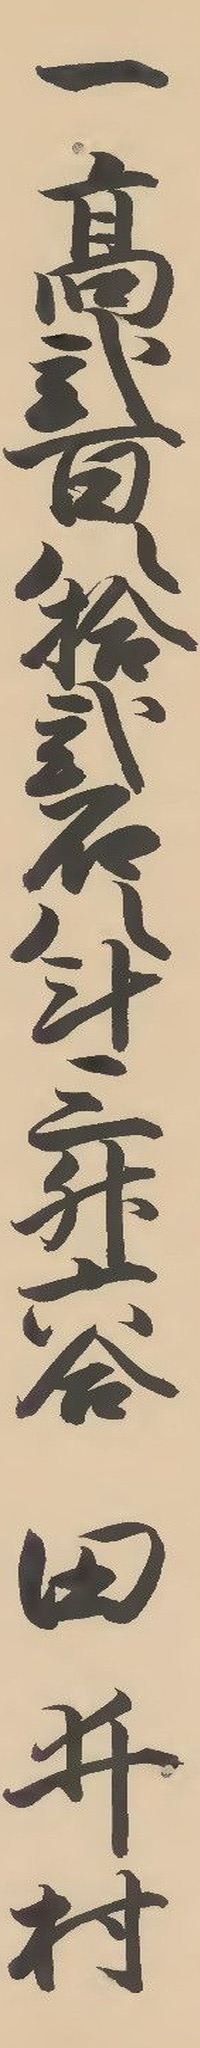一髙弐百八拾弐石八斗三升六合田井村
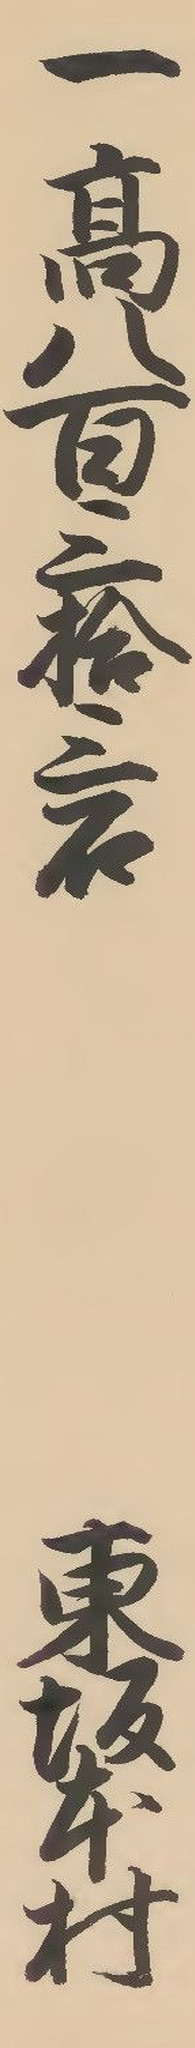一髙八百三拾三石東坂本村

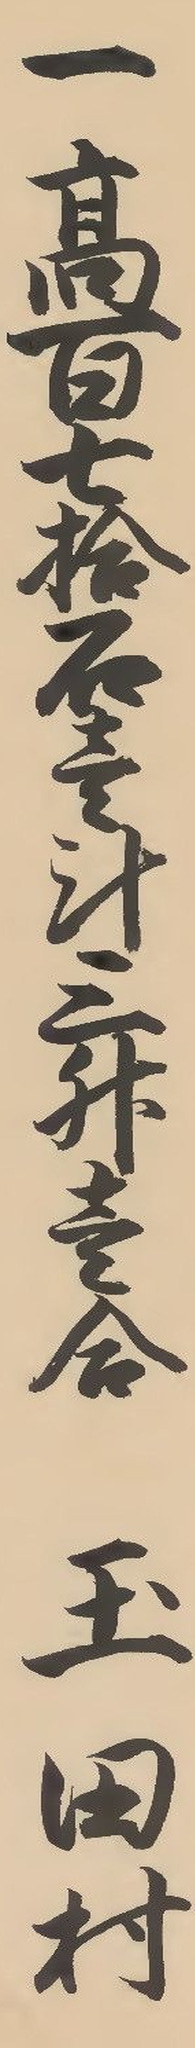一髙百七拾石壱斗三升壱合玉田村
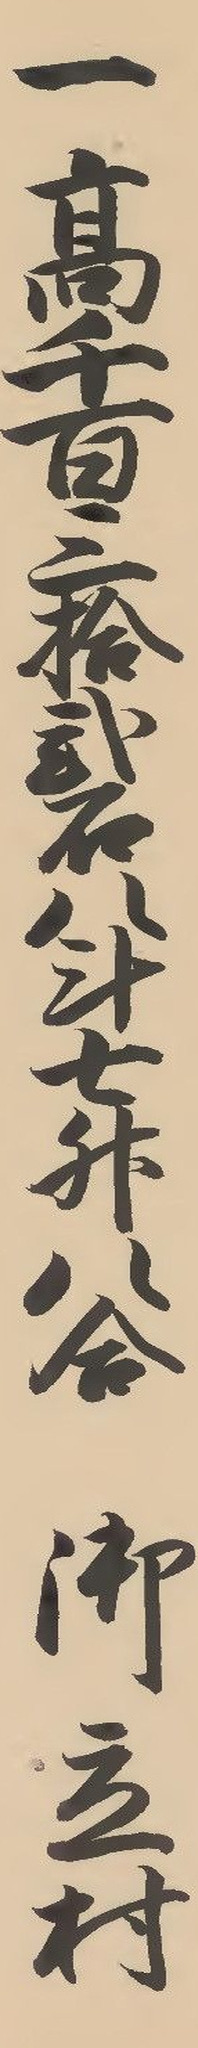一髙千百三拾弐石八斗七升八合御立村
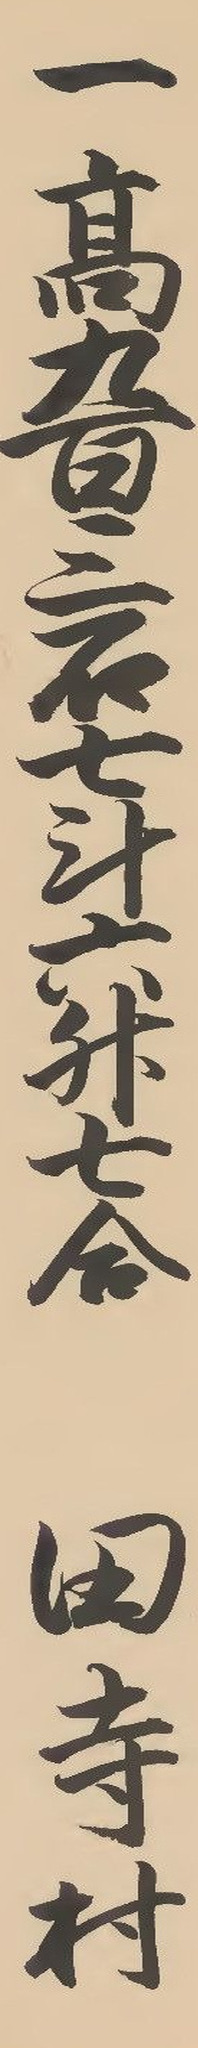一髙九百三石七斗六升七合田寺村
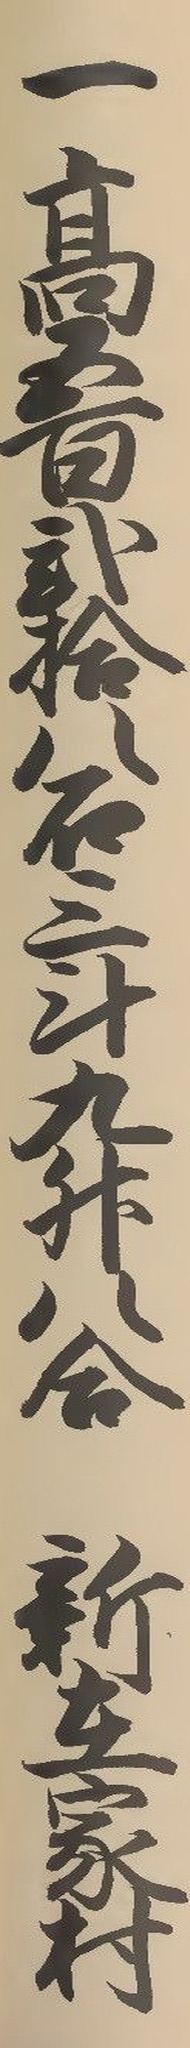一髙五百弐拾八石三斗九升八合新在家村
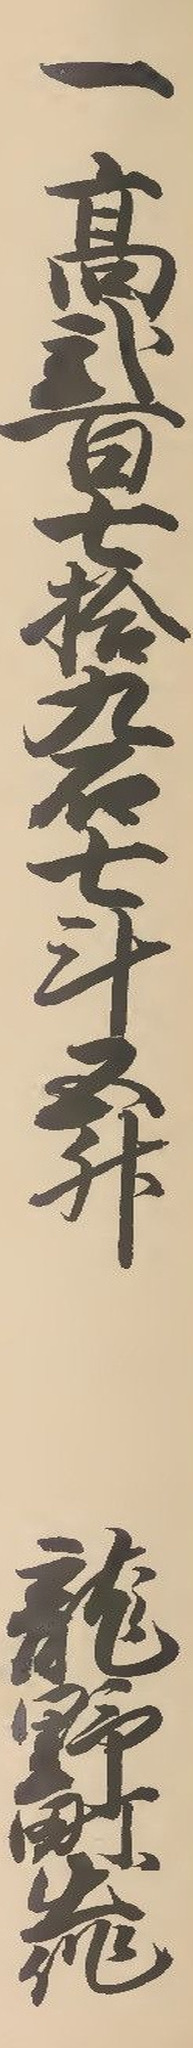一髙弐百七拾九石七斗五升龍野町出作
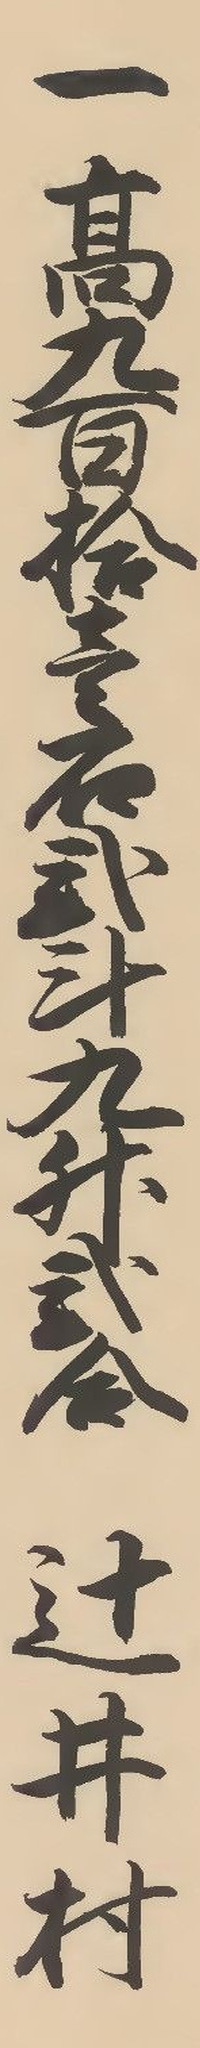一髙九百拾壱石弐斗九升弐合辻井村
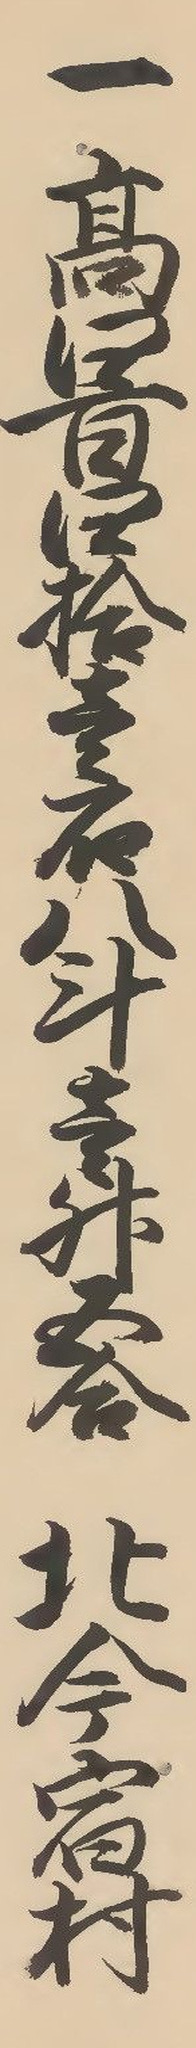一髙四百四拾壱石八斗壱升五合北今宿村
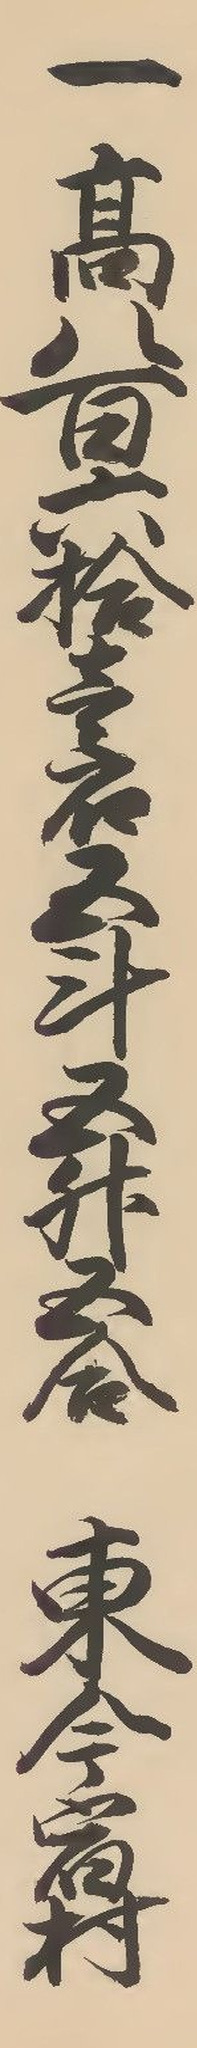一髙八百六拾壱石五斗五升五合東今宿村

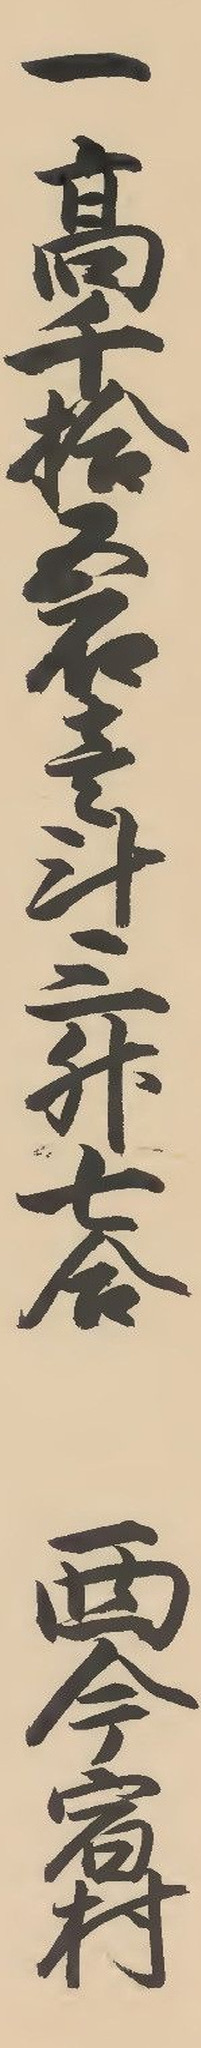一髙千拾五石壱斗三升七合西今宿村
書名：播磨国郷帳
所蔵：国立公文書館 National Archives of Japan
